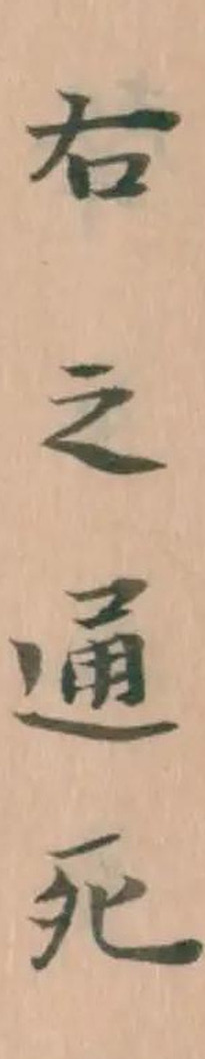右之通死
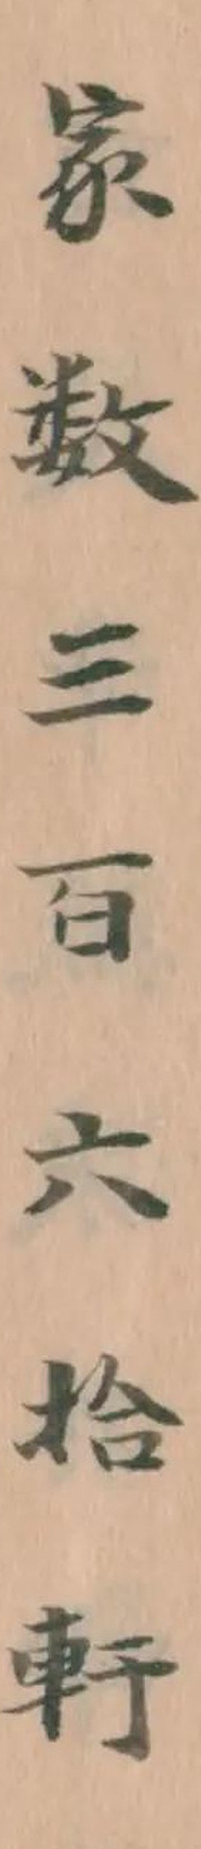家数三百六拾軒
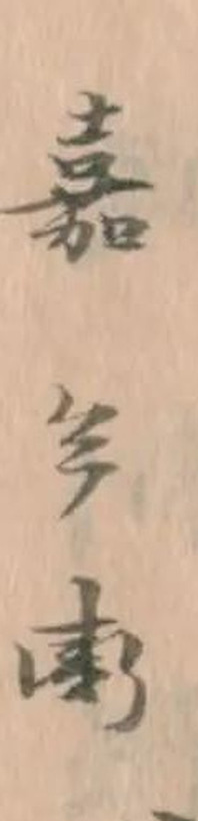嘉兵衛
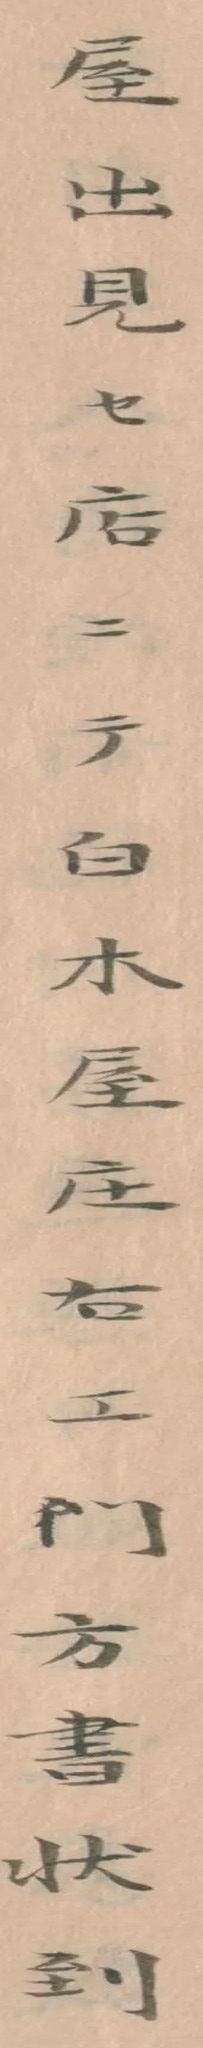屋出見セ店ニテ白木屋庄右衛門方書状到
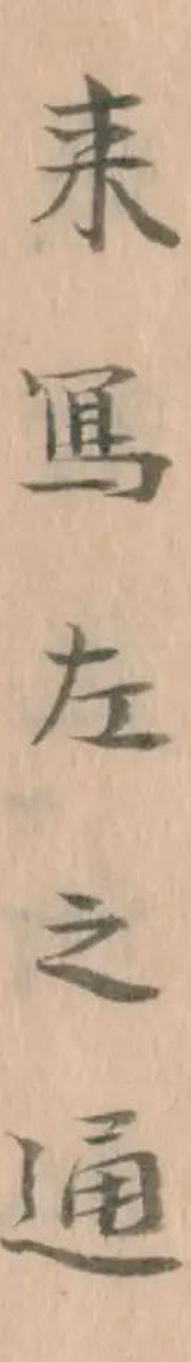来写左之通
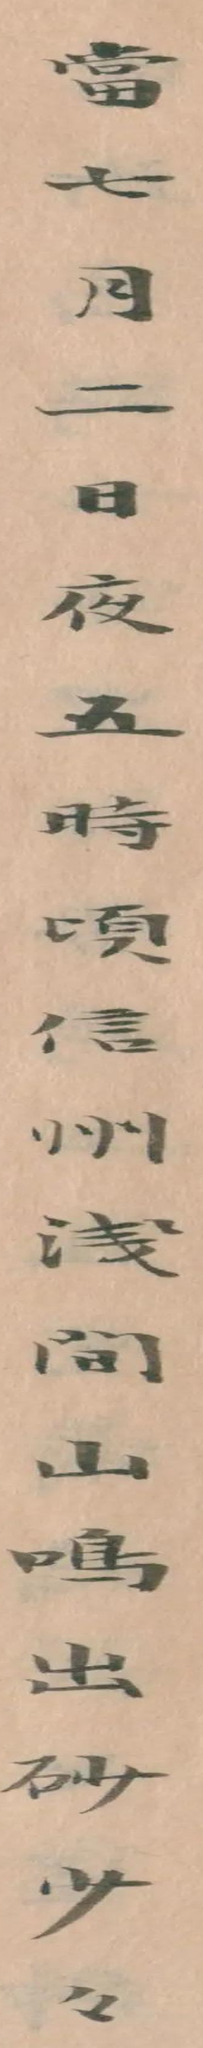一当七月二日夜五時頃信州浅間山鳴出砂少々
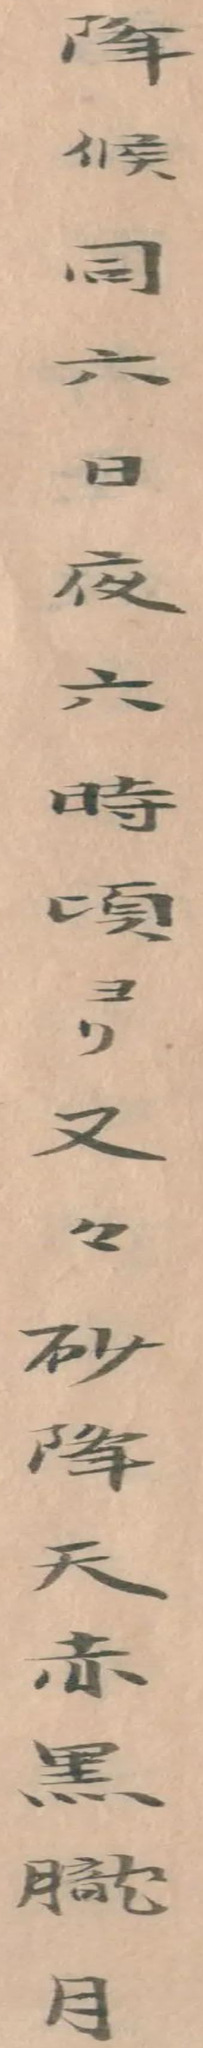降候同六日夜六時頃ヨリ又々砂降天赤黒朧月
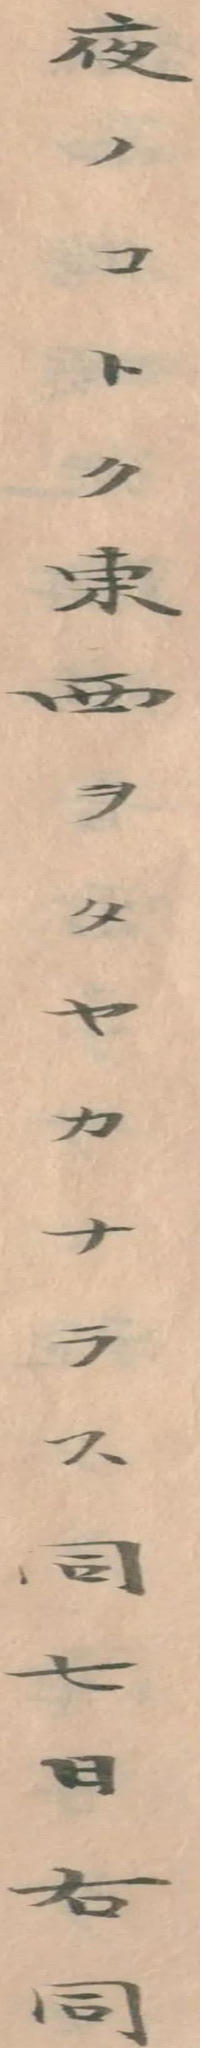夜ノ͡コトク東西ヲタヤカナラス同七日右同

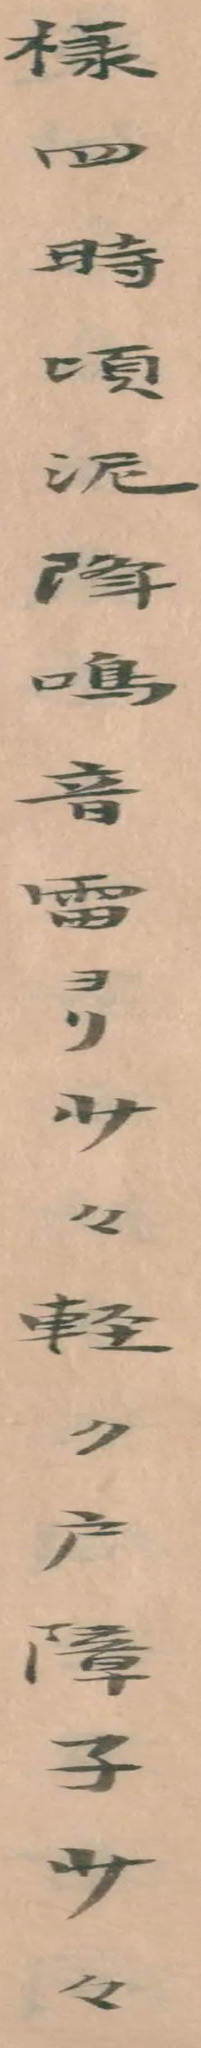儀四時頃泥降鳴音雷ヨリ少々軽ク戸障子少々
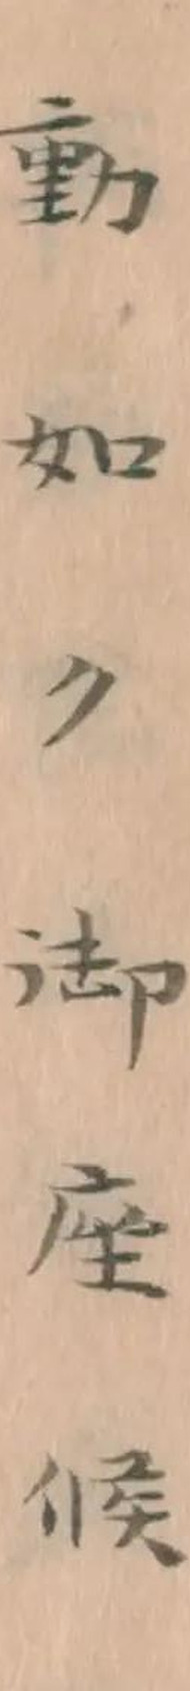動如ク御座候
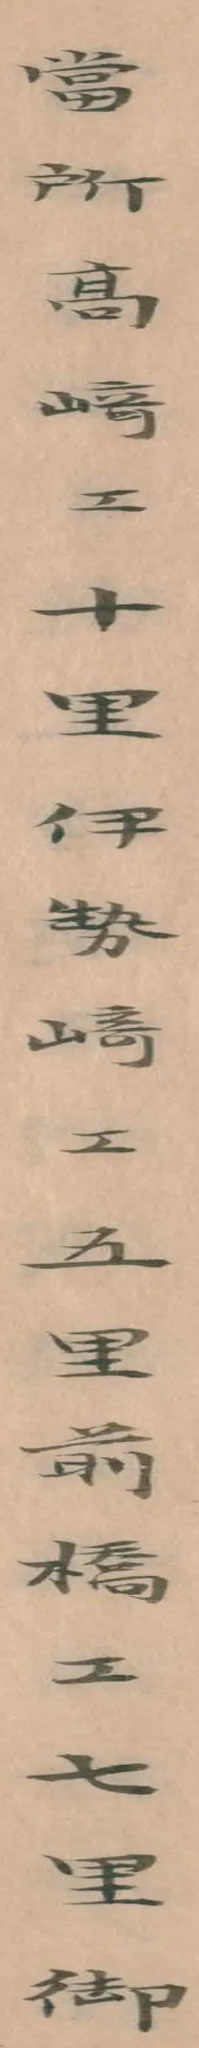一当所高崎エ十里伊勢崎エ五里前橋エ七里御
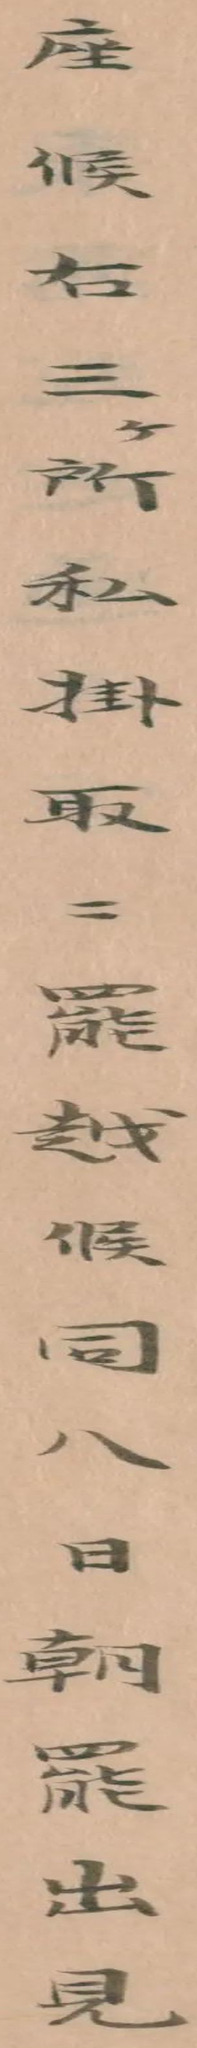座候右三ヶ所私掛取二罷越候同八日朝罷出見
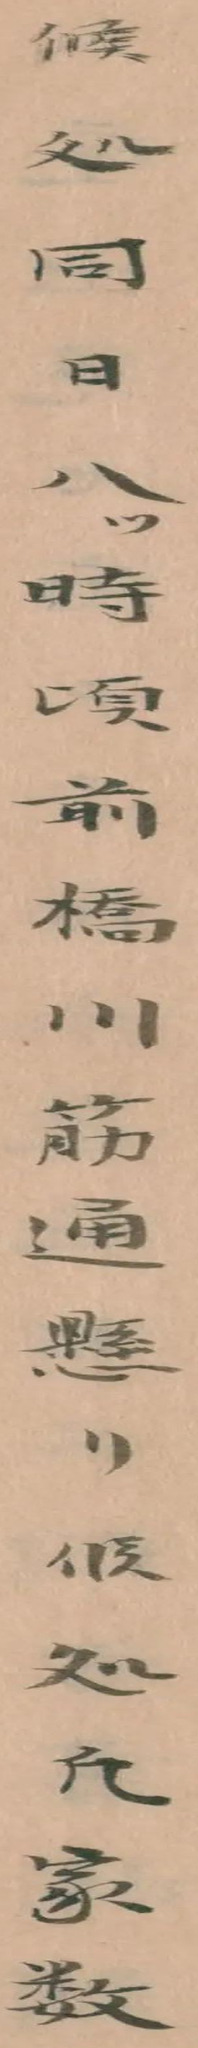候処同日八ッ時頃前橋川筋通懸り候処凡家数
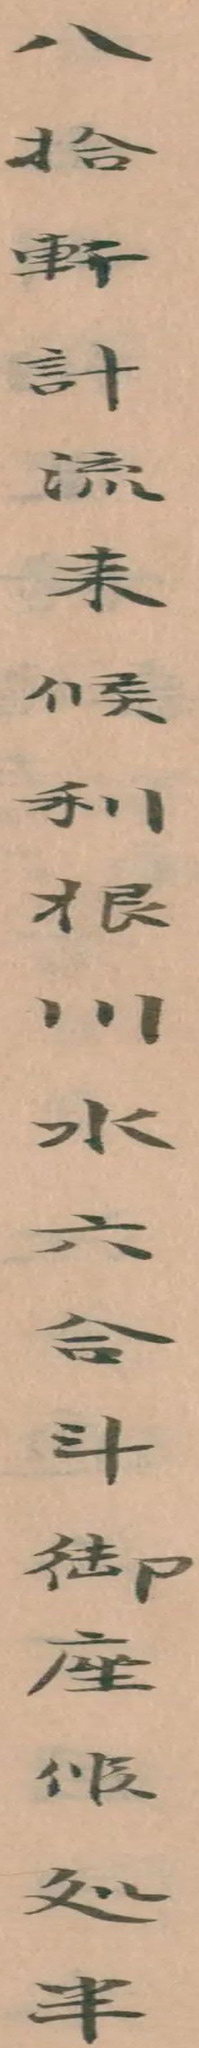八拾軒計流来候利根川水六合斗御座候処半
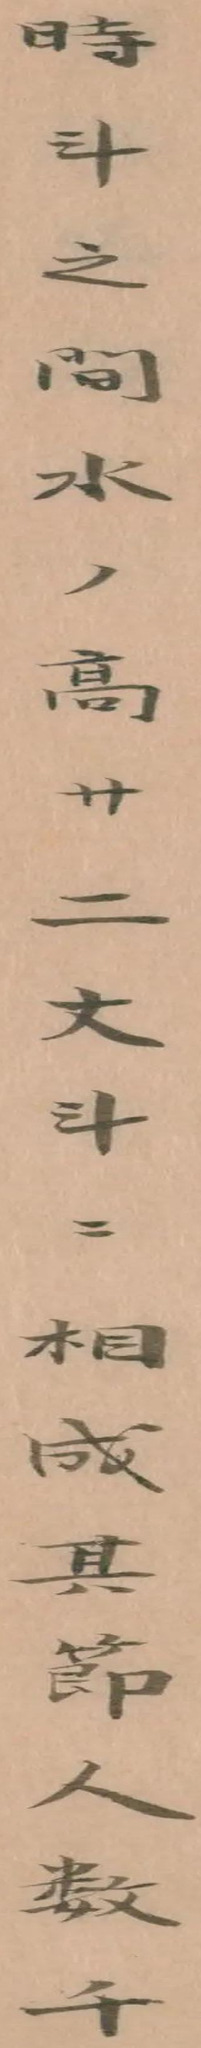時斗之間水ノ高サ二丈斗二相成其節人数千
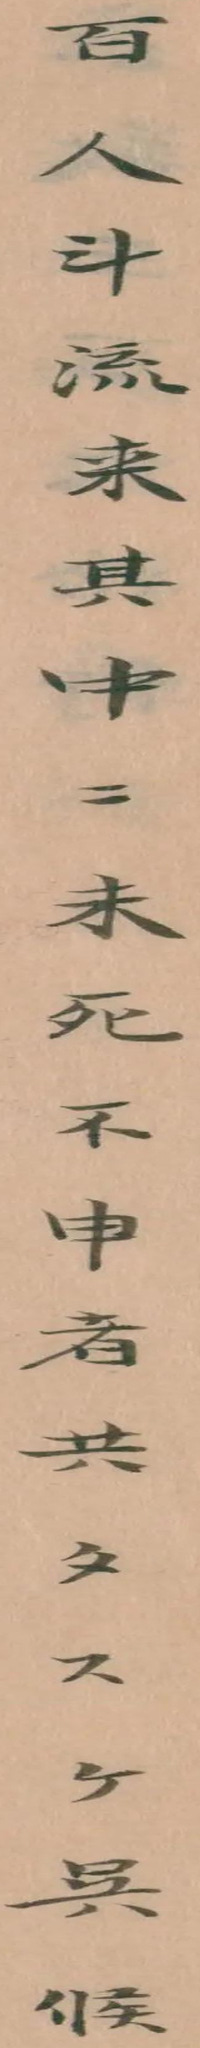百人斗流来其中二未死不申者共タスケ呉候
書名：地災撮要. 巻1(噴火山・地震ノ部)
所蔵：国立国会図書館 National Diet Library, JAPAN
